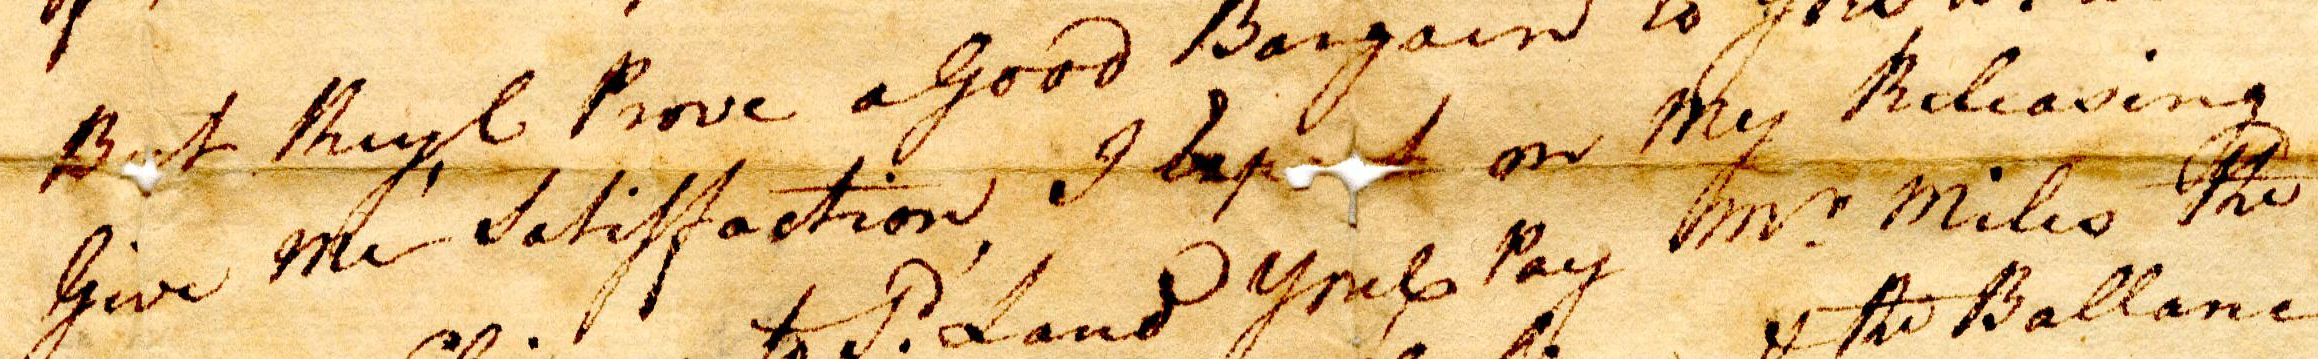give me Satisfaction, I b[_____] on my Releasing
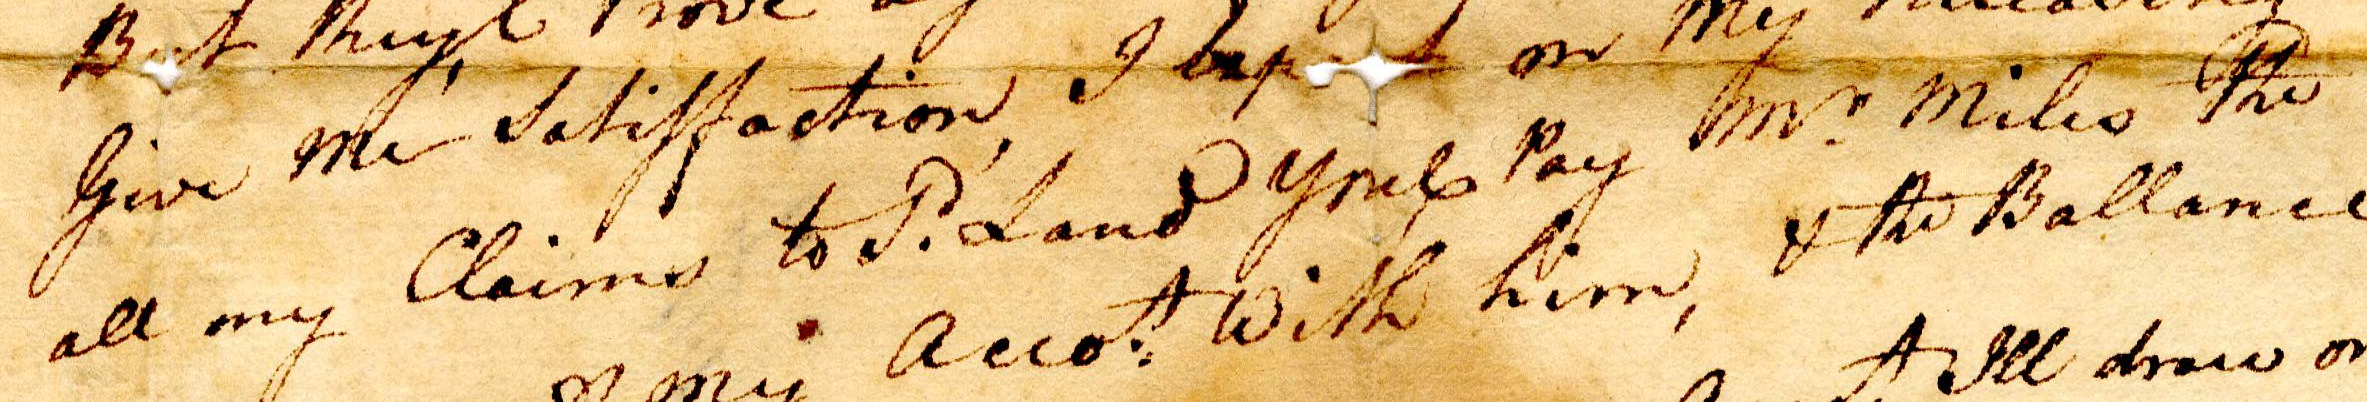all my Claim to s^d. Land Youl Pay M^r. Miles the
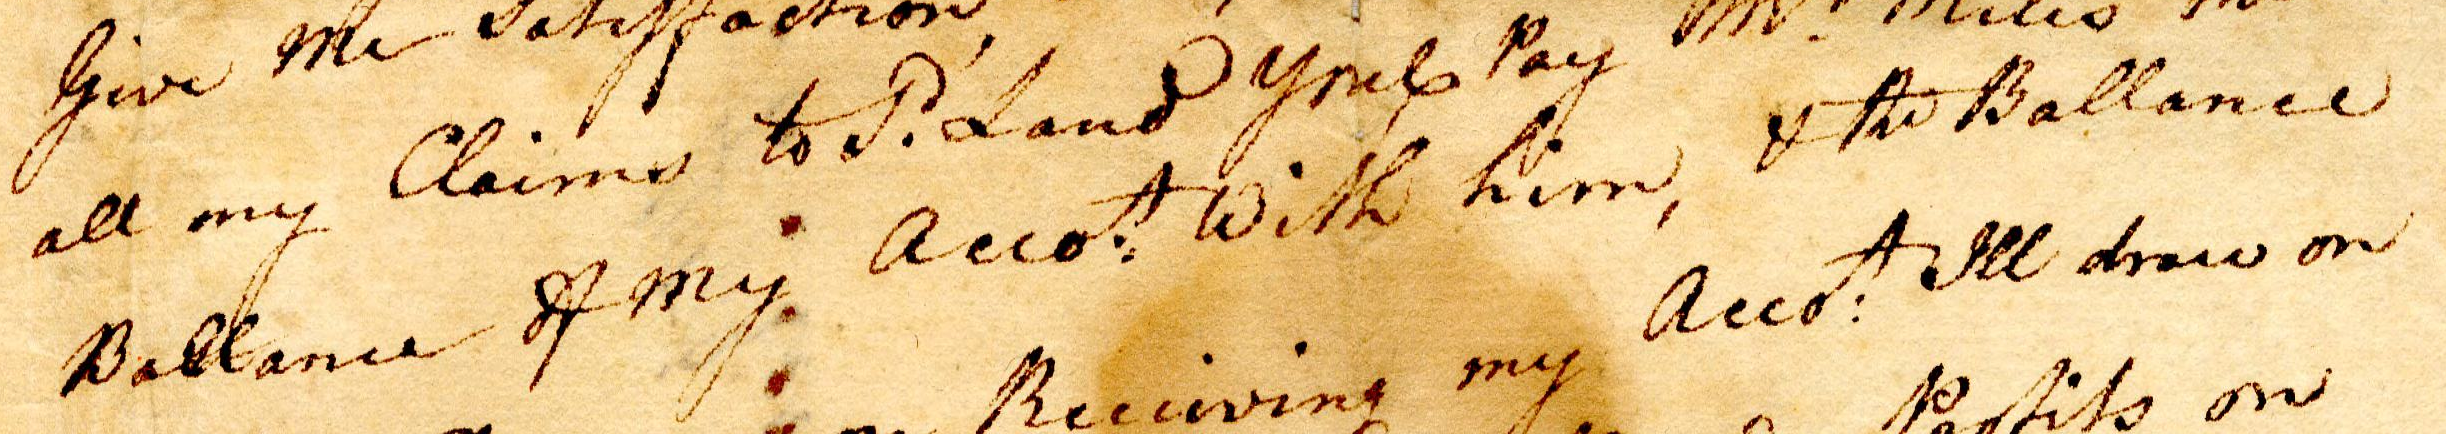Ballance of my Acco^t. with him, & the Ballance
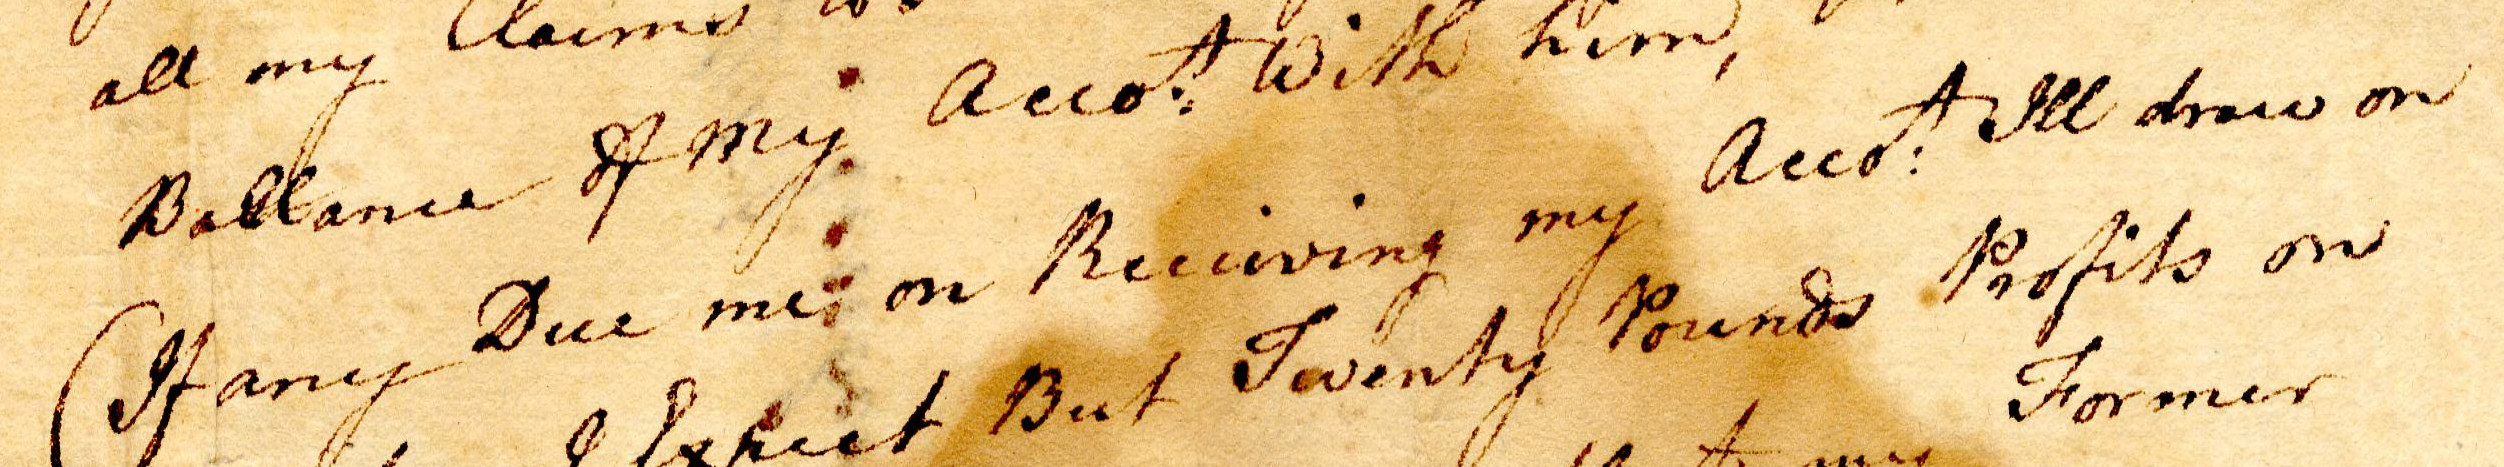(If any Due me on Receiving my Acco^t: Ill draw on
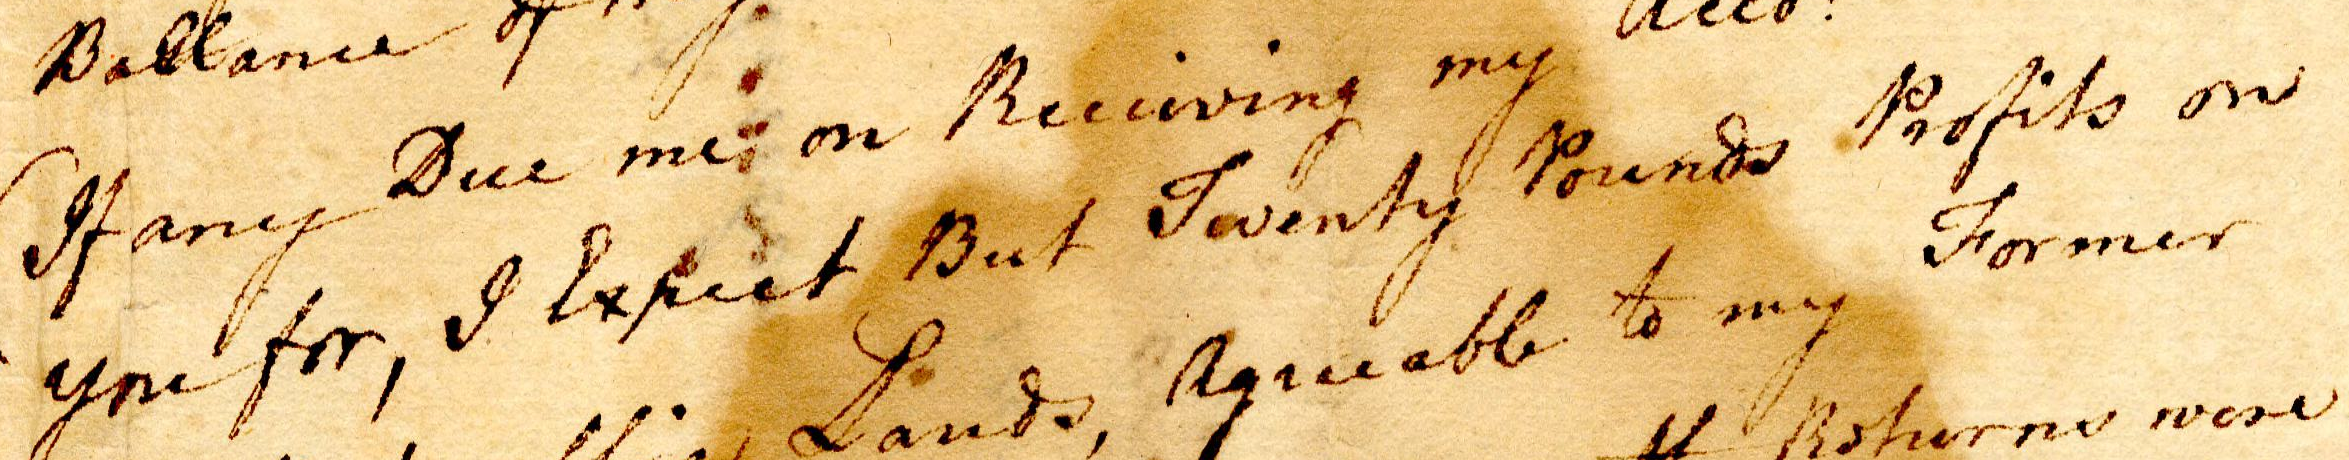you for, I Expect but Twenty Pounds Profits on
